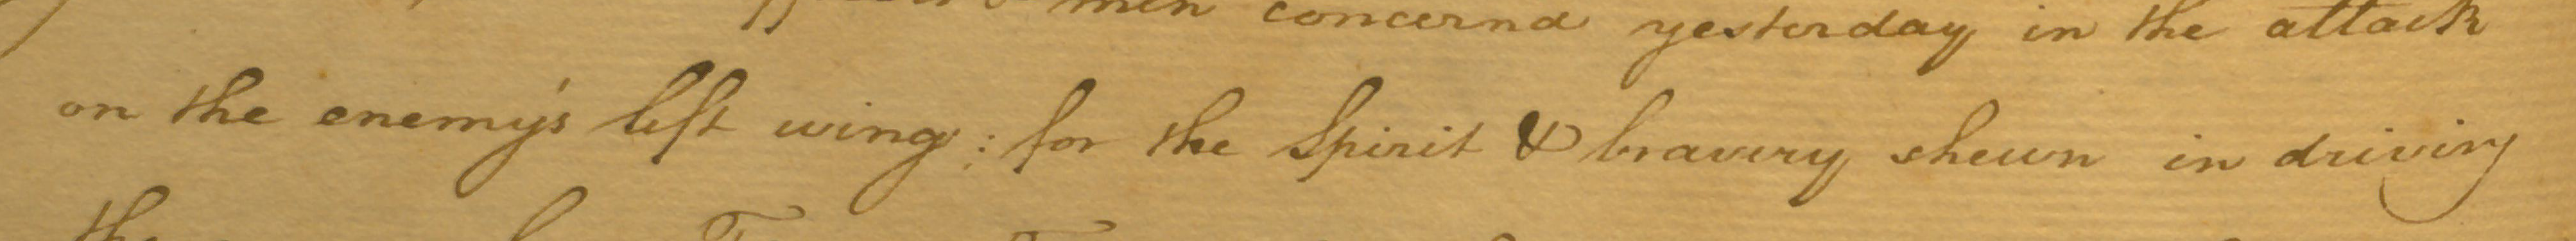on the enemy's left wing for the Spirit & bravery shewn in driving
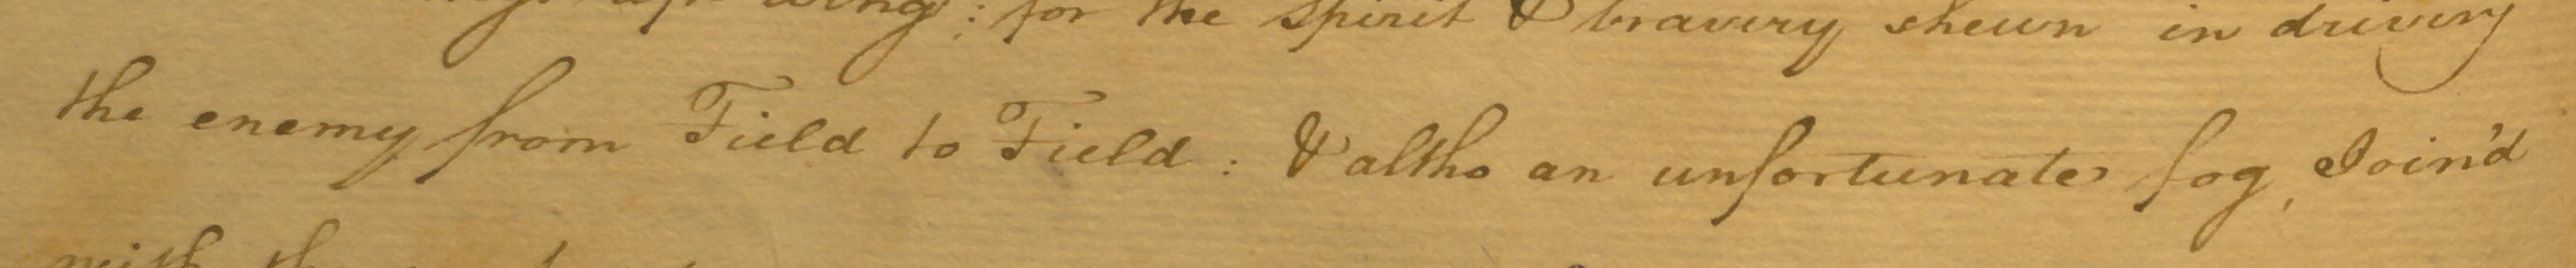the enemy from Field to Field: & altho an unfortuate fog Join'd
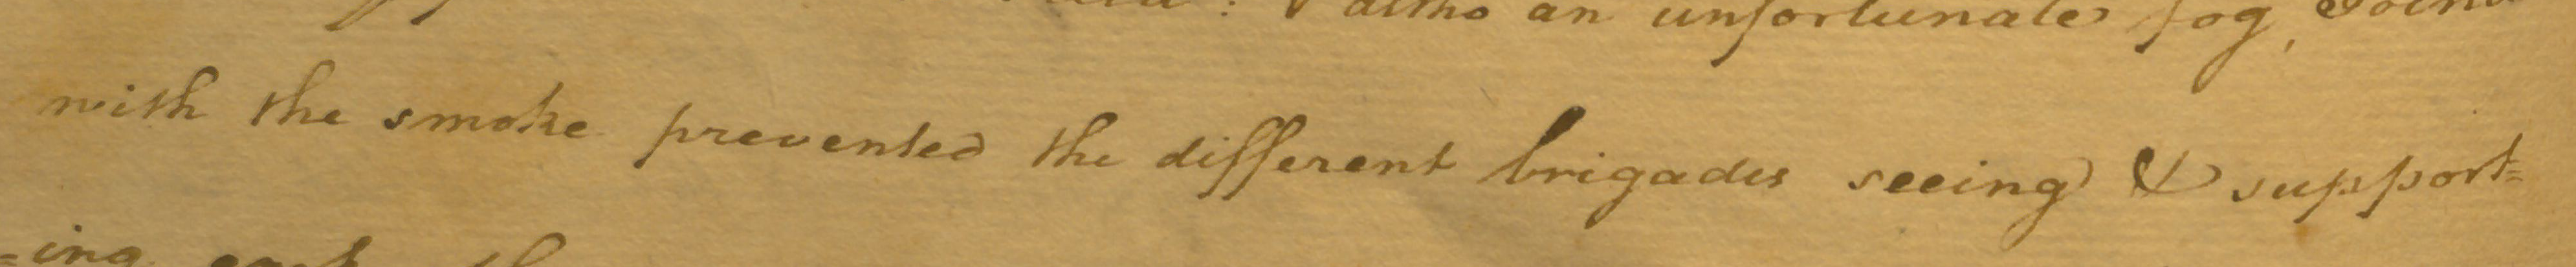with the smoke prevented the different brigades seeing & support
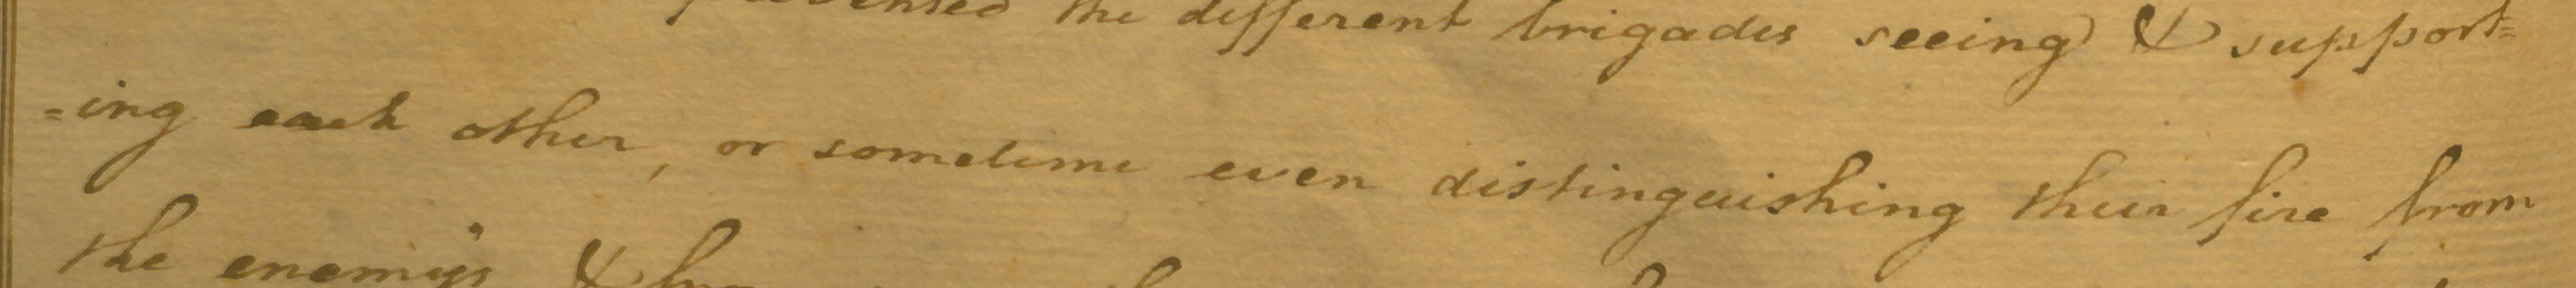-ing each other, or sometime even distinguishing their fire from
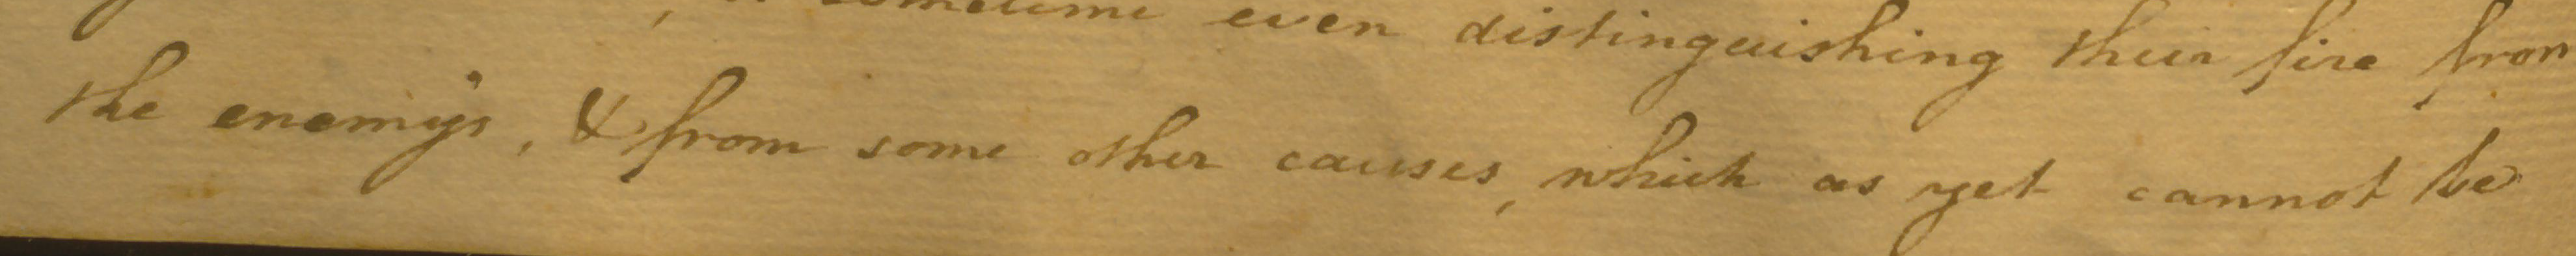the enemy's, & from some other causes, which as yet cannot be
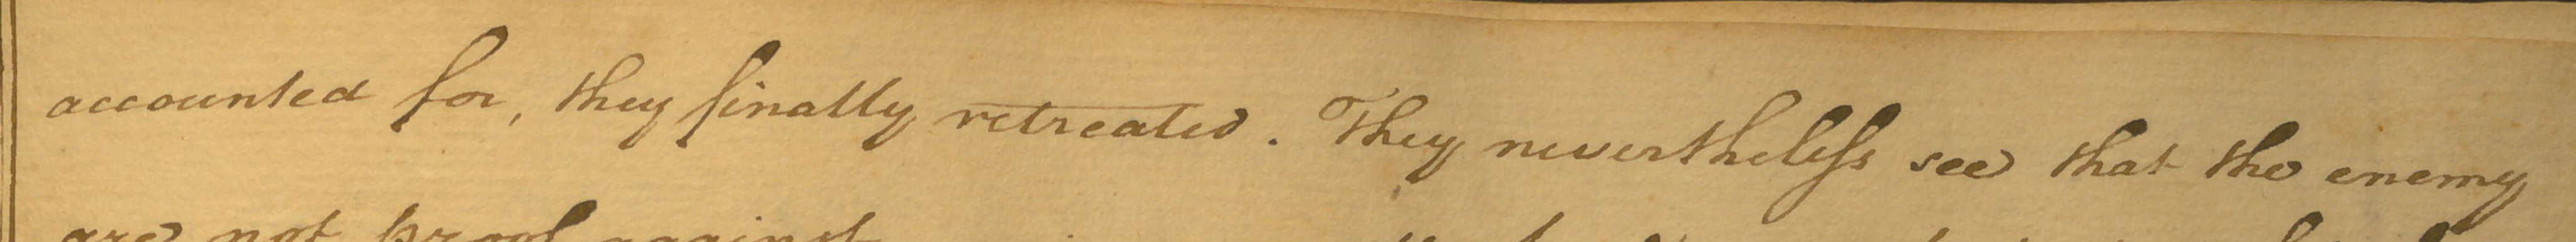accounted for, they finally retreated. They nevertheless see that the enemy
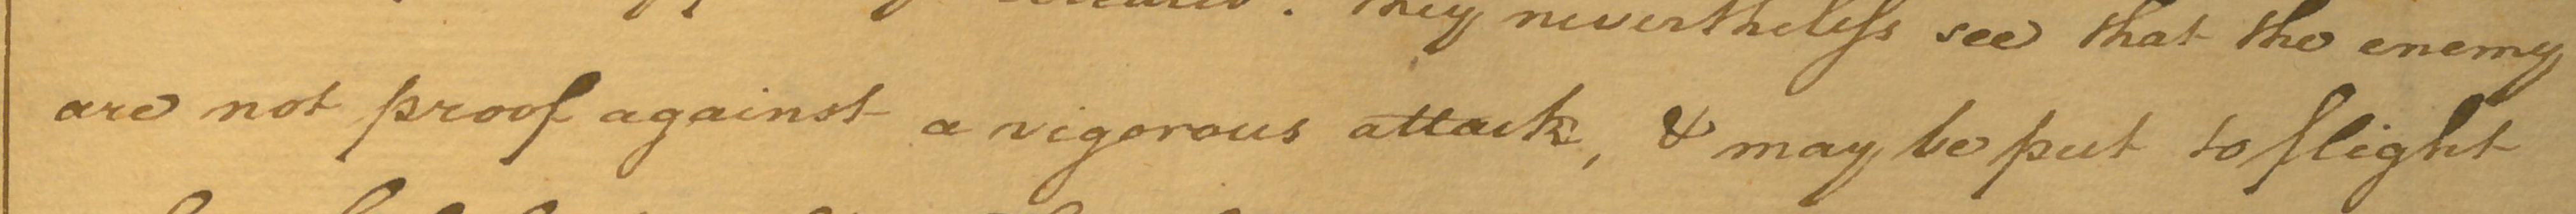are not proof against a vigorous attack, & may be put to flight
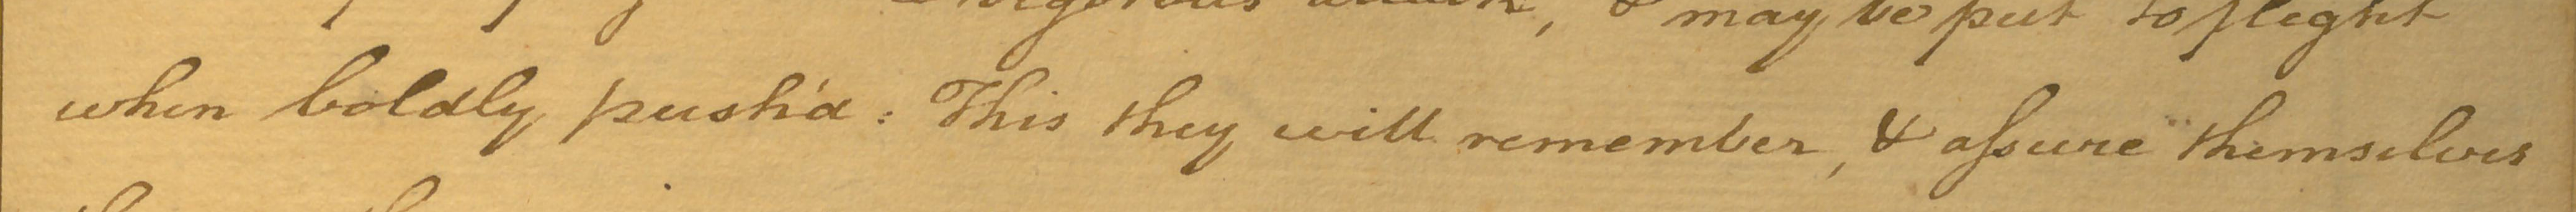when boldly push'd: This they will remember, & assure themselves
